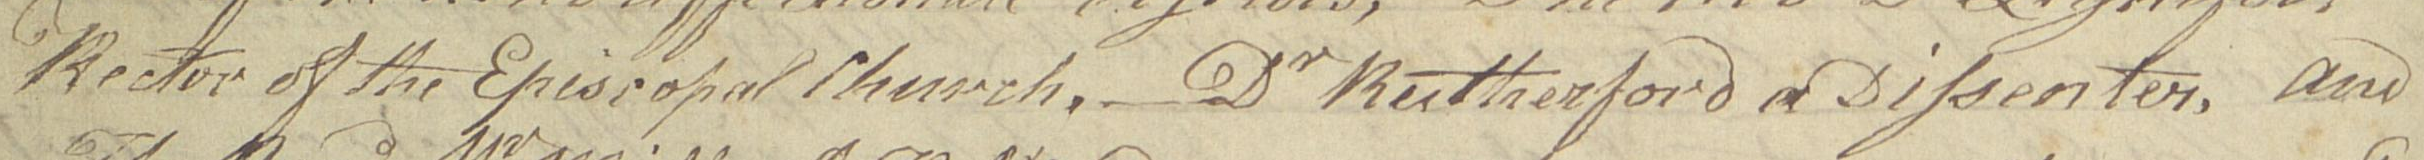Rector of the Episcopal Church. D^r Rutherford a dissenter, and
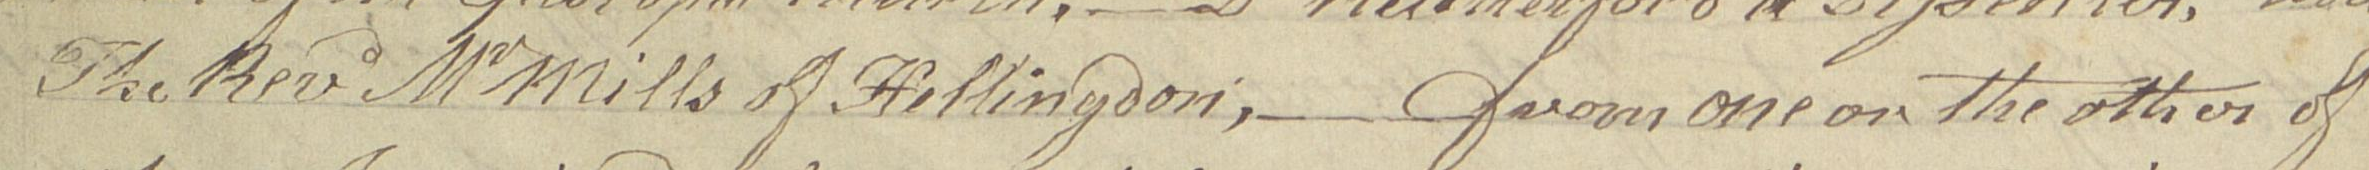The Rev^d M^r Mills of Hillingdon; from one or the other of
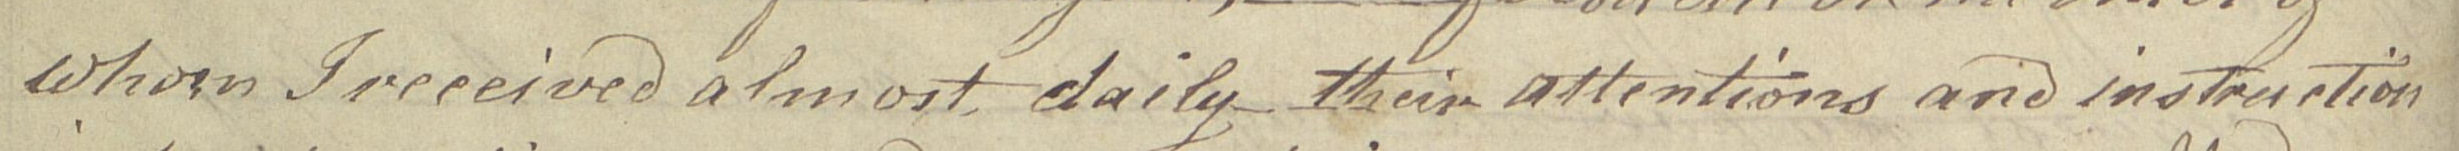whom I received almost daily their attentions and instruction
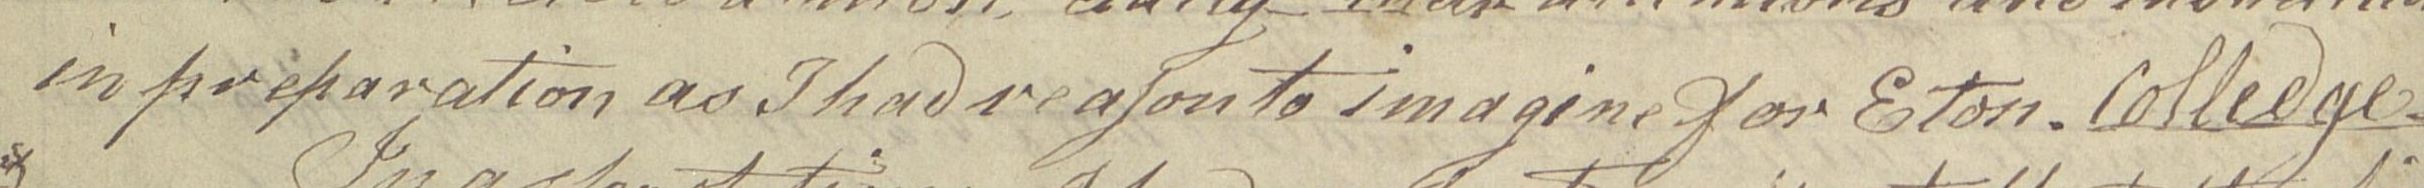in preparation as I had reason to imagine for Eton. Colledge
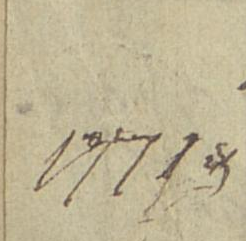1771
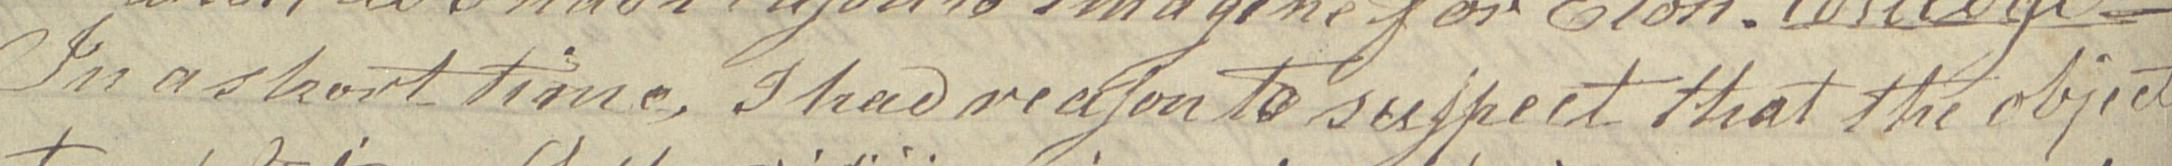In a short time, I had reason to suspect that the object
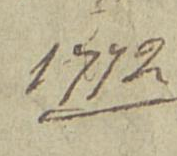1772
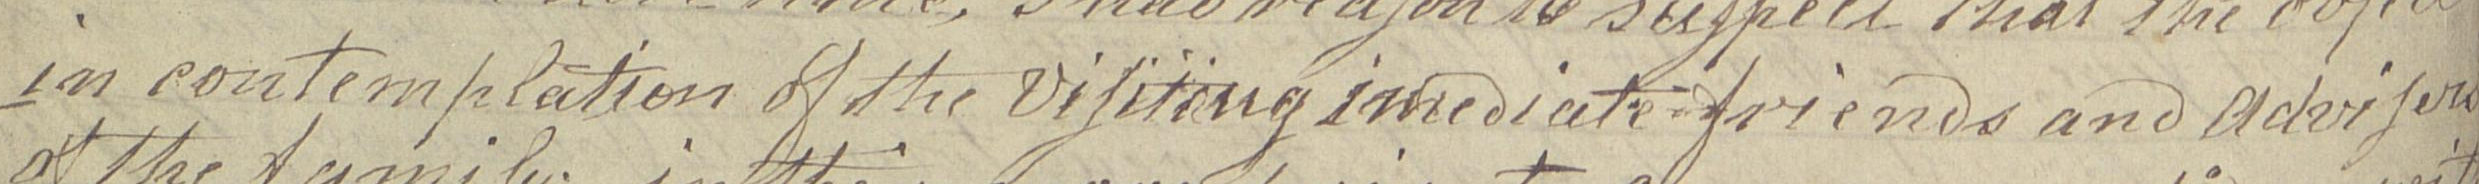in contemplation of the visiting imediate friends and Advisers
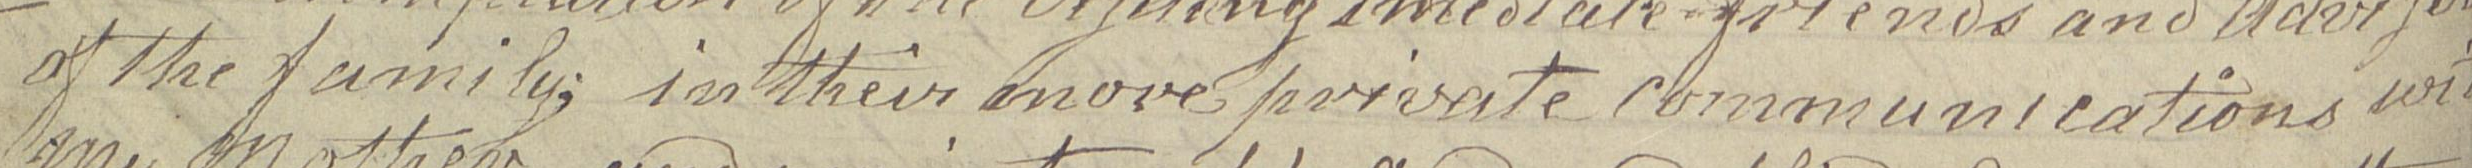of the family; in their more private communications with
